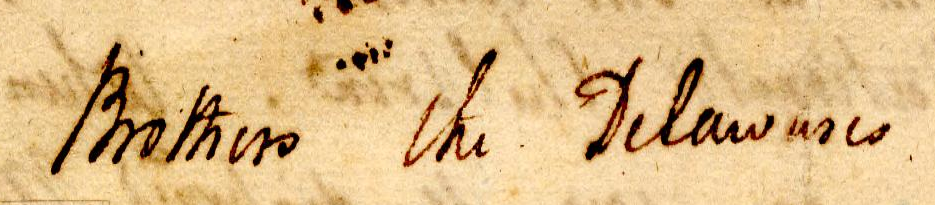Brothers the Delawares
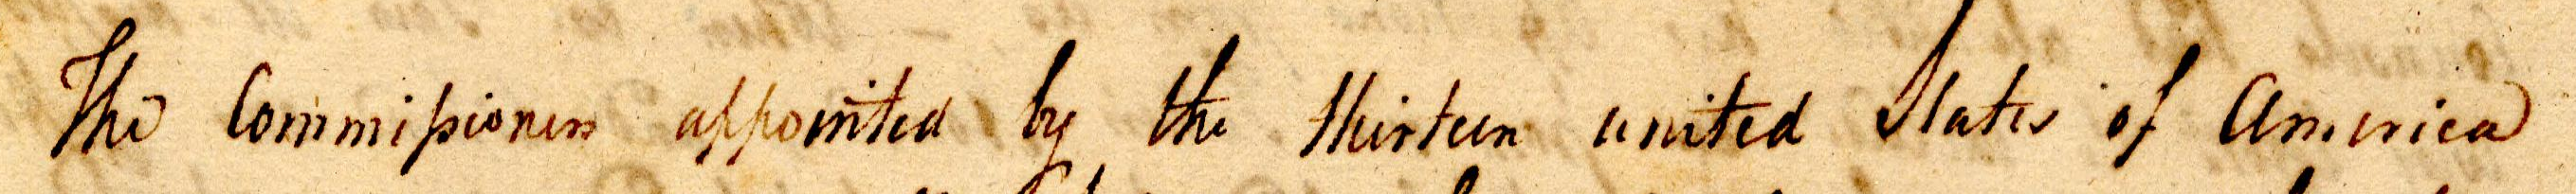The Commissioners appointed by the thirteen united States of America
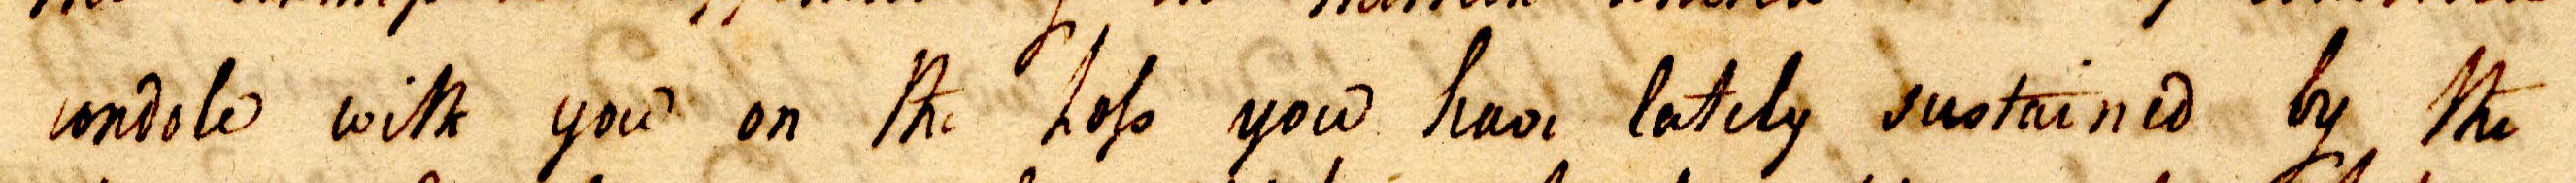condole with you on the Loss you have lately sustained by the
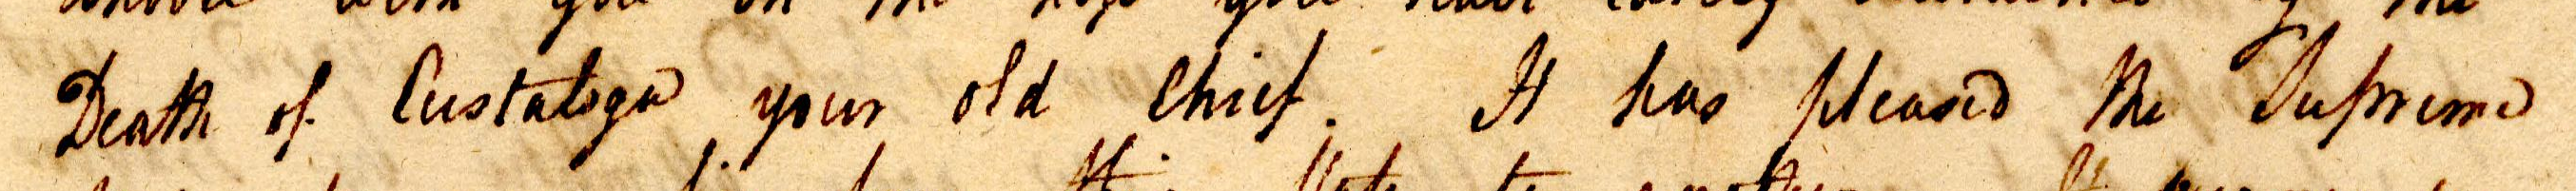Death of Custaloga your old Chief. It has pleased the Supreme
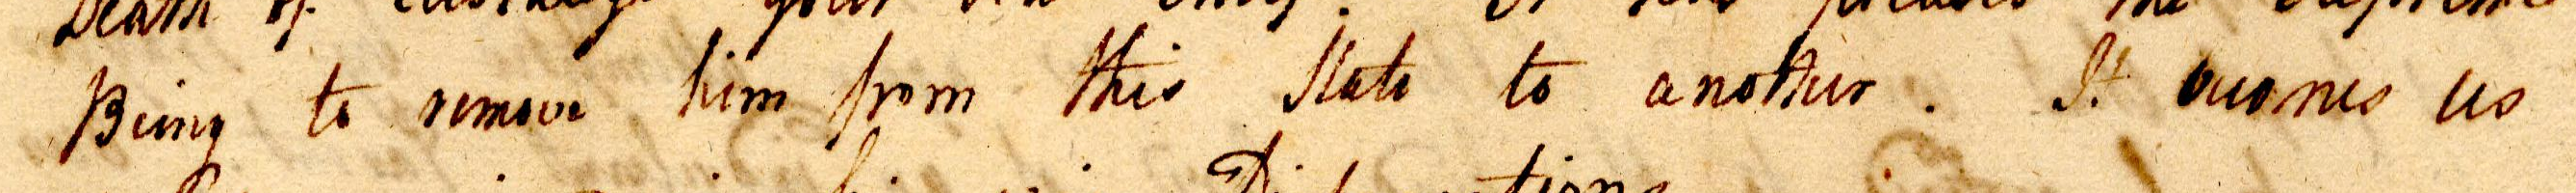Being to remove him from this State to another. It becomes us
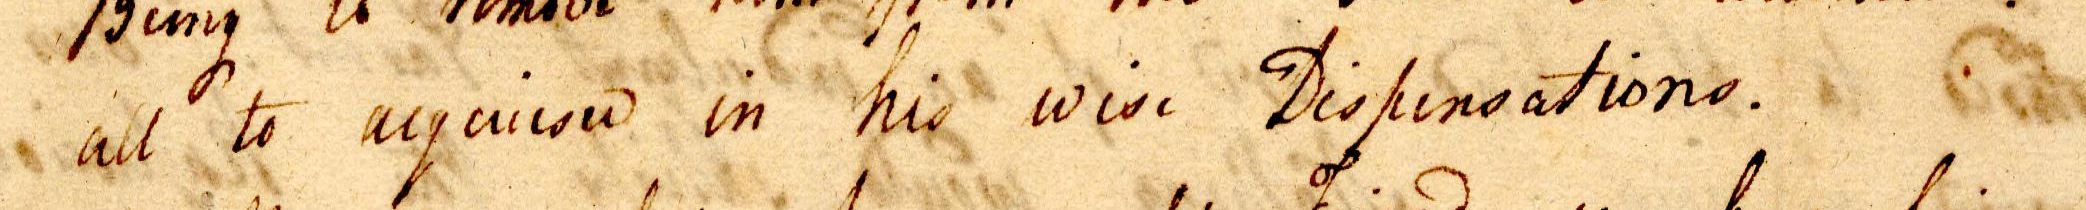all to acquiesce in his wise Dispensations.
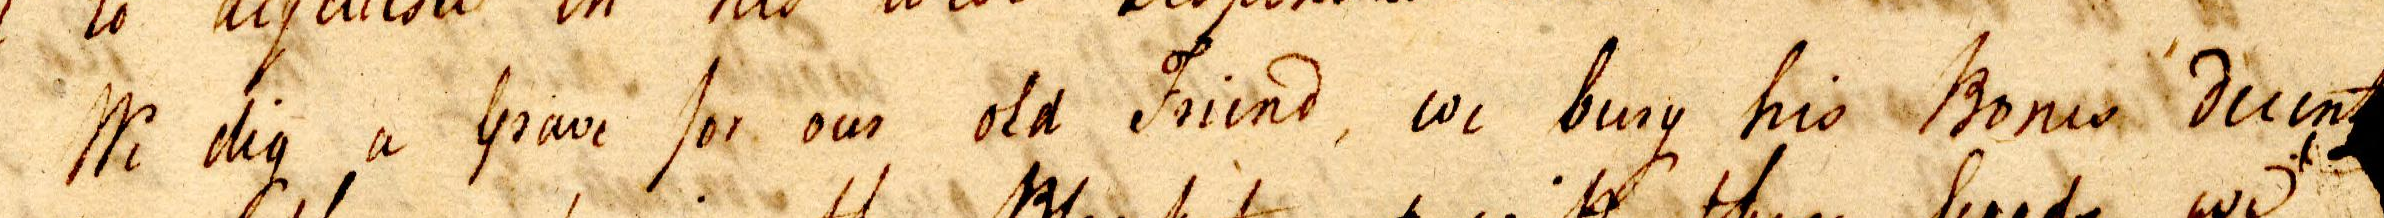We dig a Grave for our old Friend, we bury his Bones decent
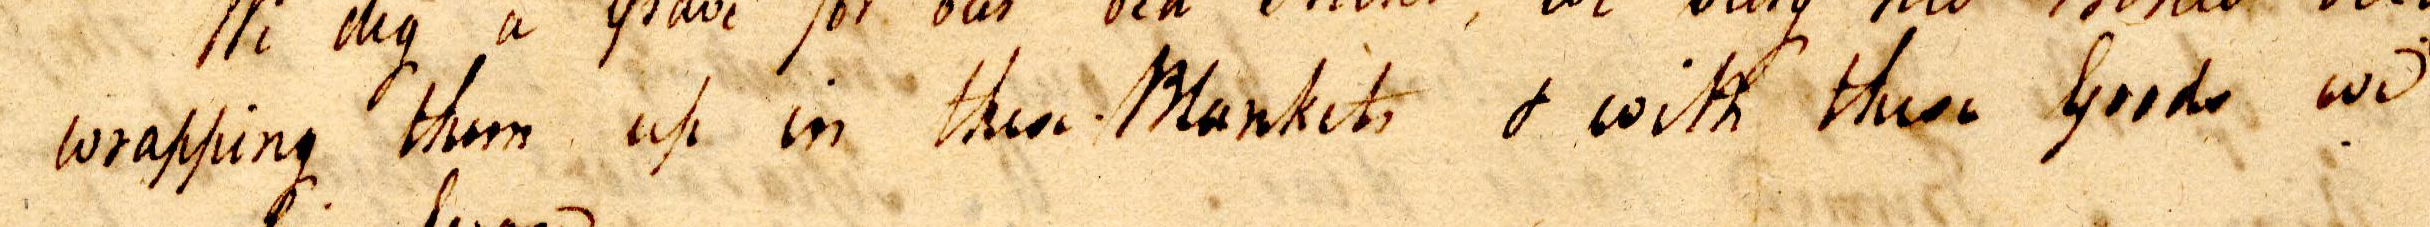wrapping them up in these Blankets & with these Goods we
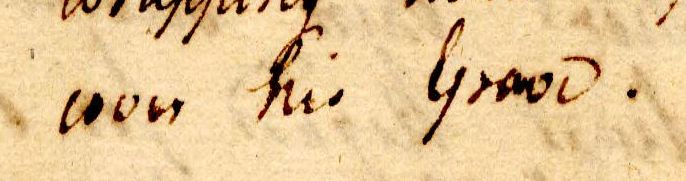cover his Grave.
